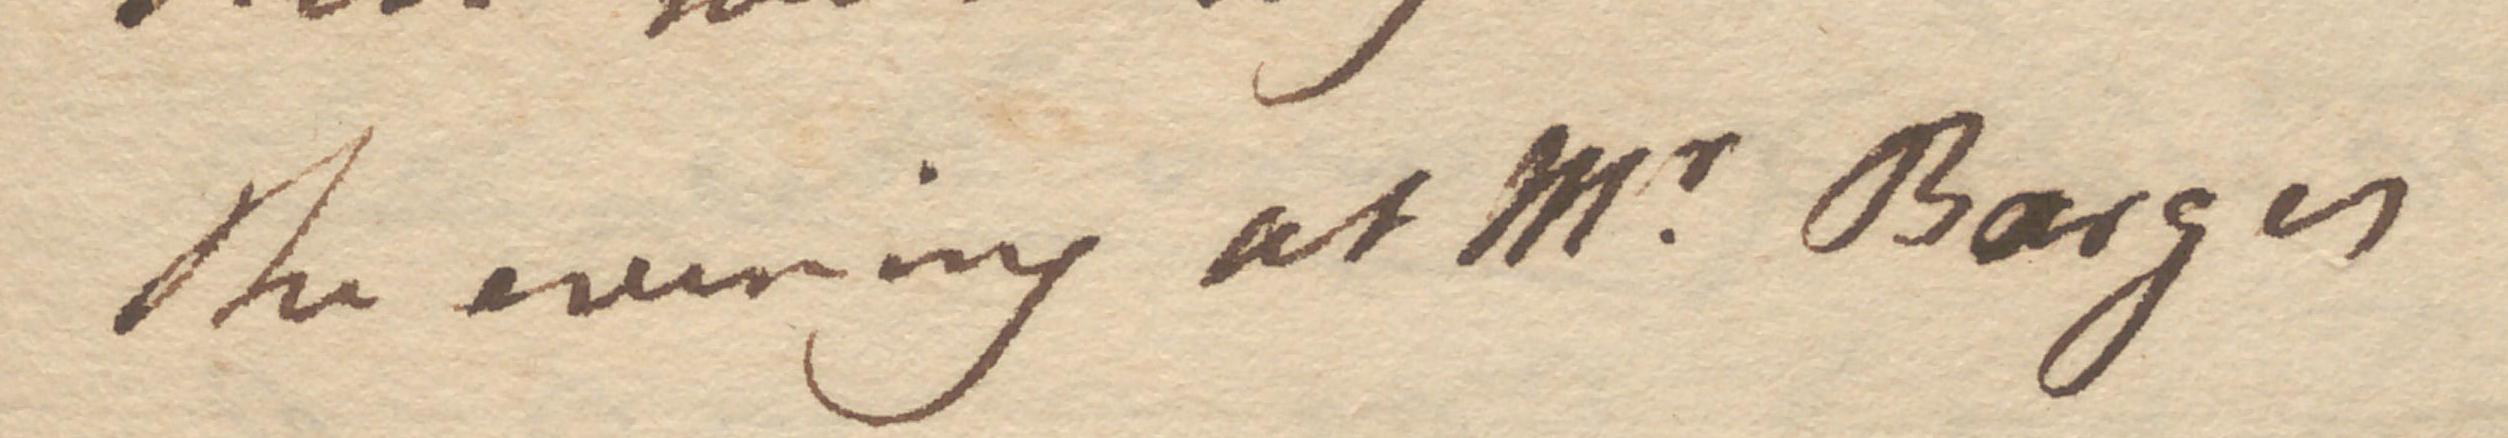the evening at M^r. Barges
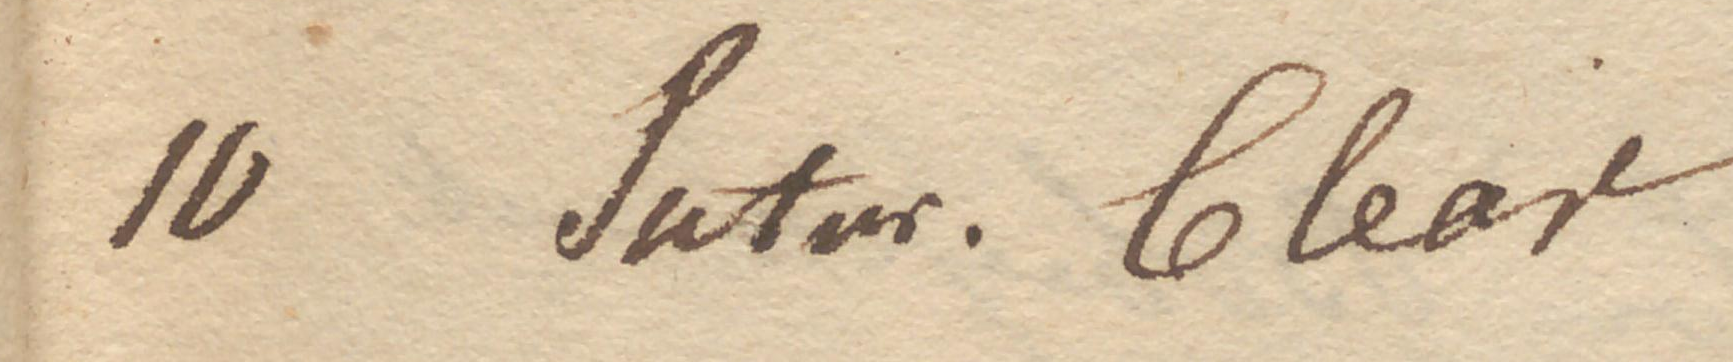10 Satur. Clear
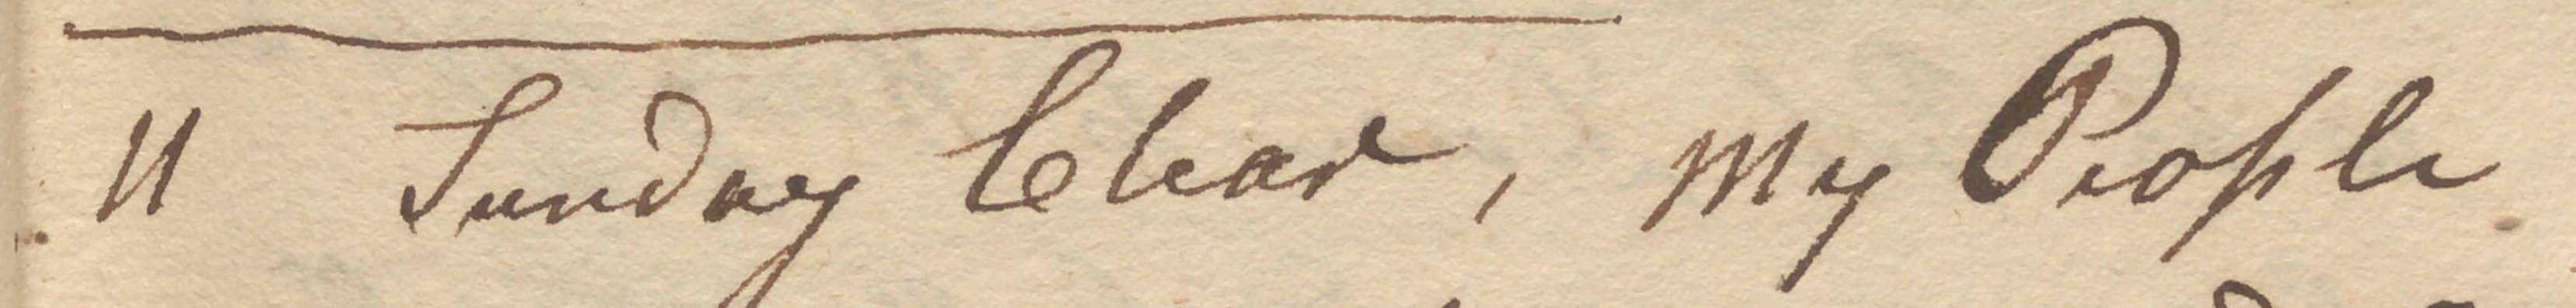11 Sunday Clear, My People
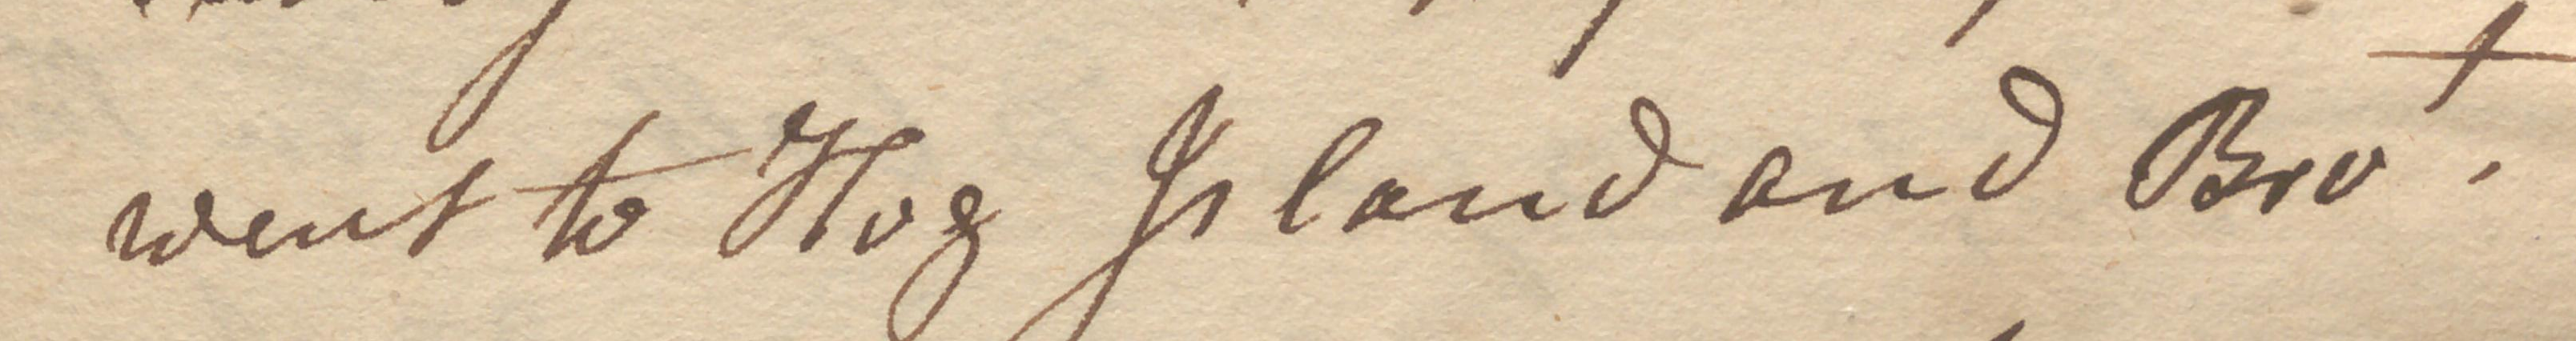went to Hog Island and Bro^t.
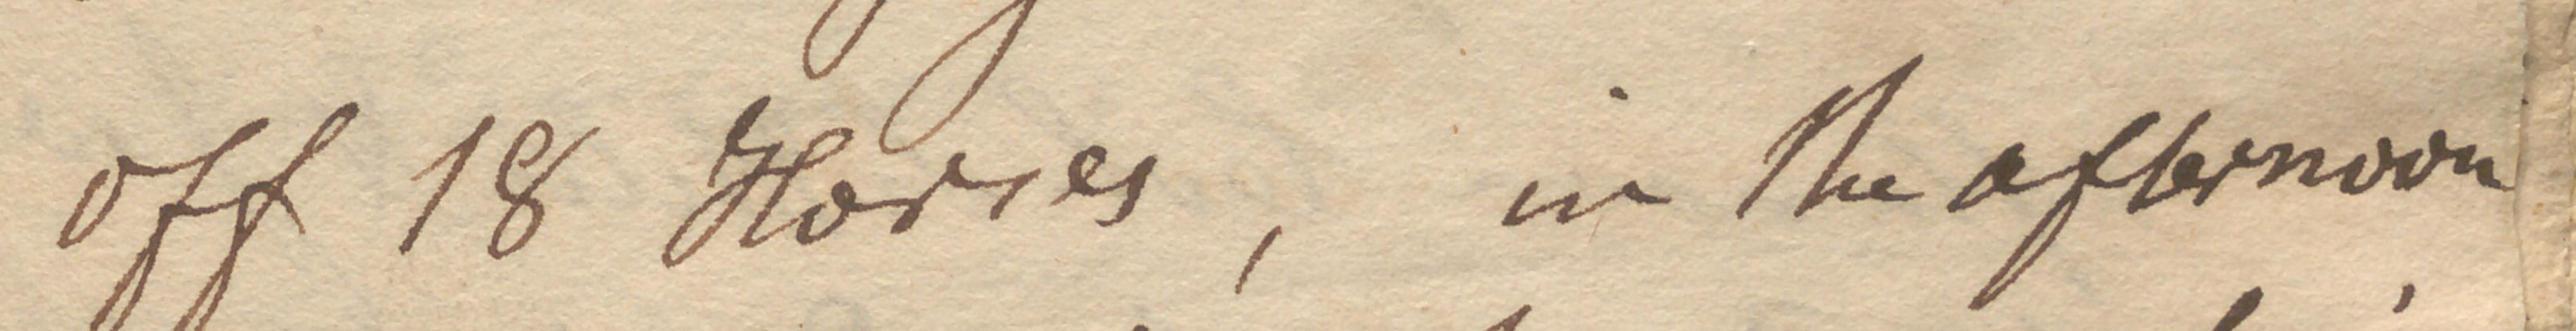off 18 Horses, in the afternoon
